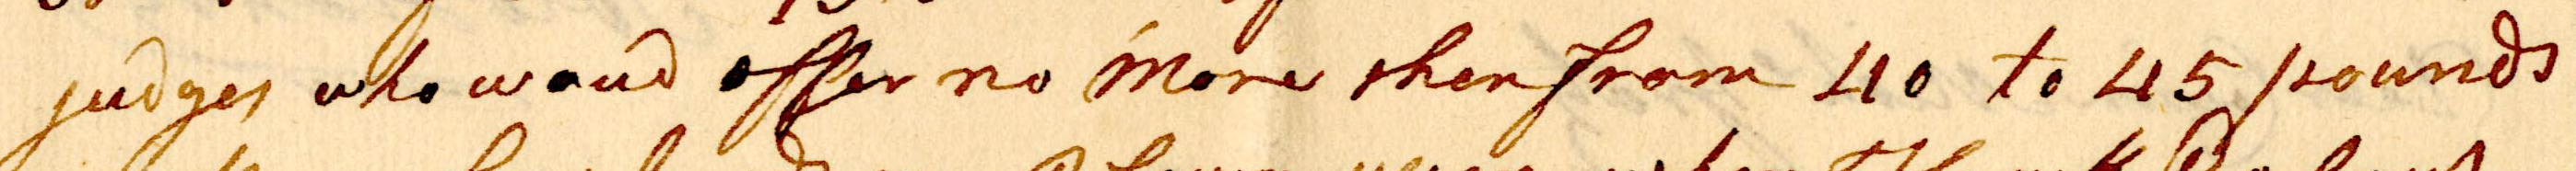judges who woud offer no more then from 40 to 45 pounds
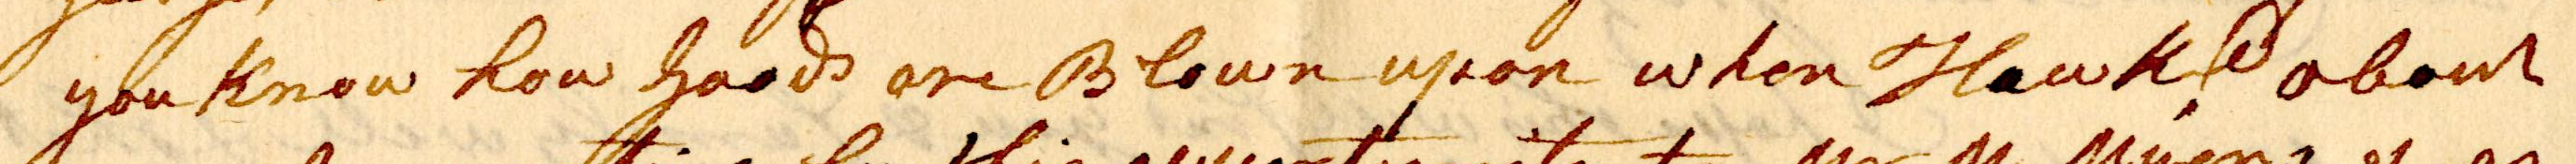you know how Goods are Blown upon when Hawk^d about
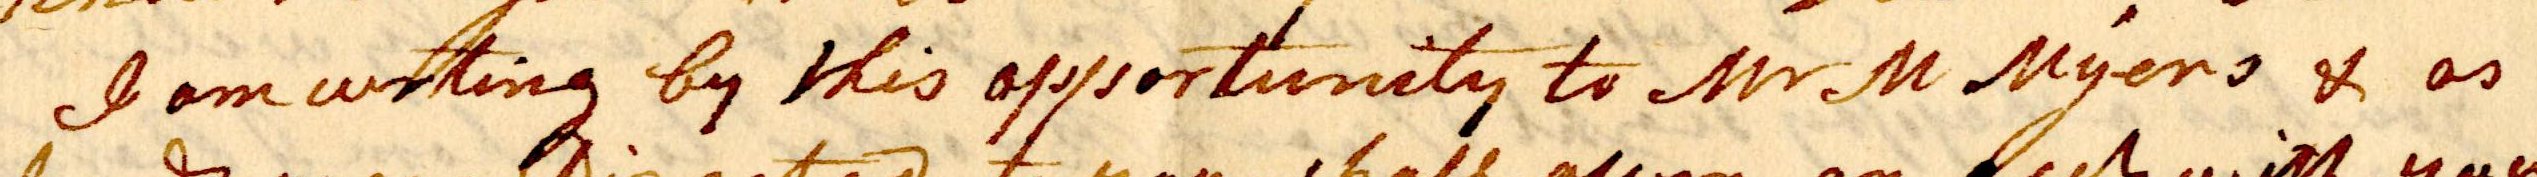I am writing by this opportunity to M^r M Myers & as
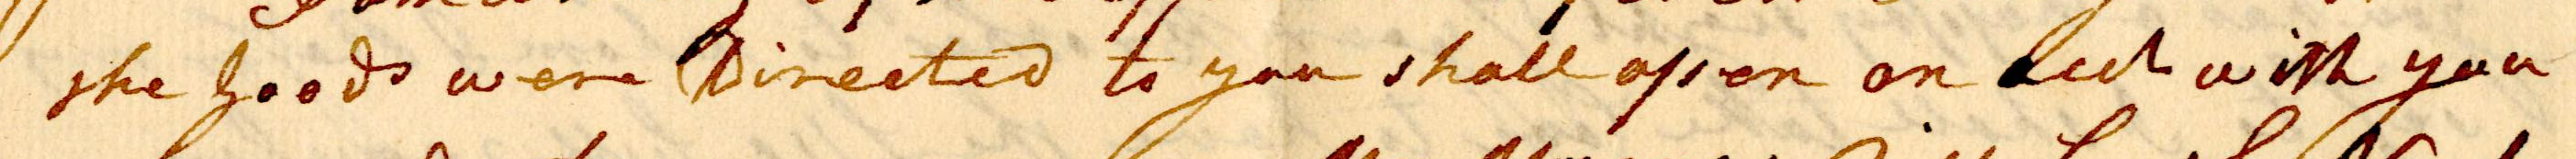the Goods were Directed to you shall offer an Acc^t with you
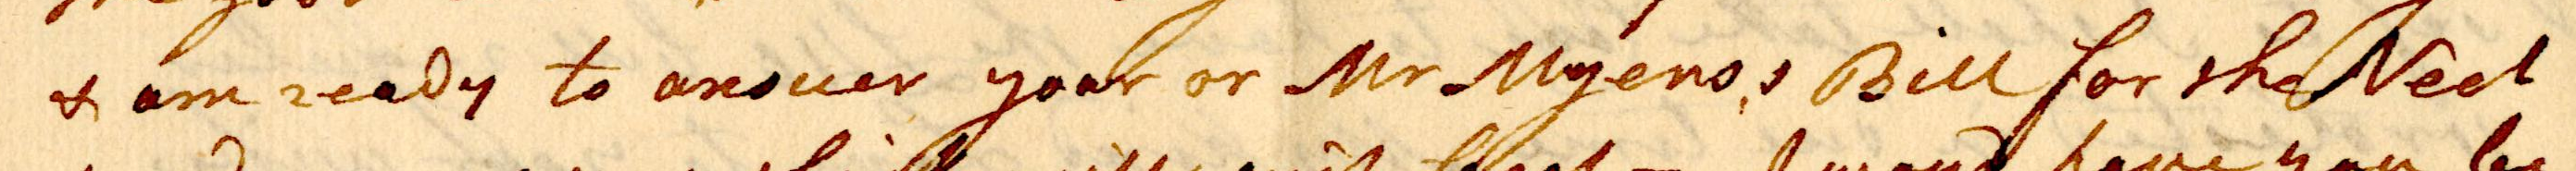& am ready to answer your or Mr Myers's Bill for the Next
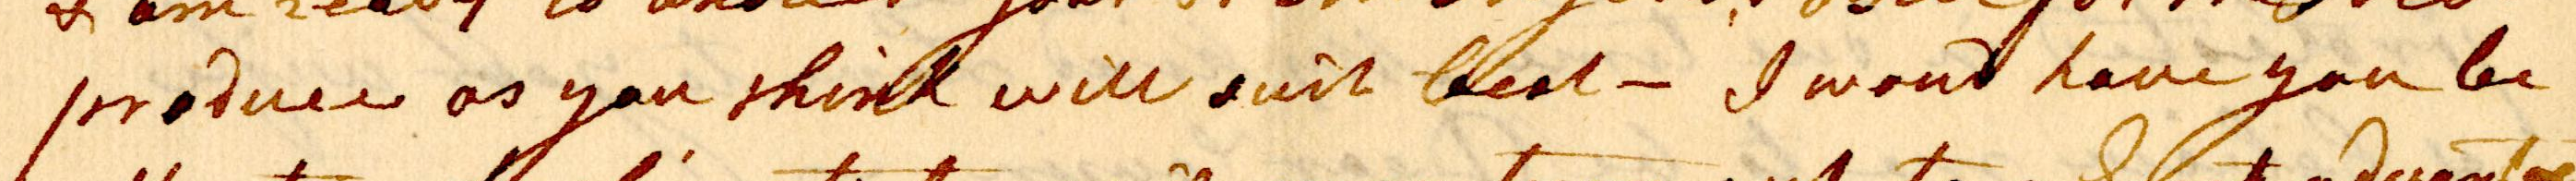produce as you think will suit best- I woud have you be
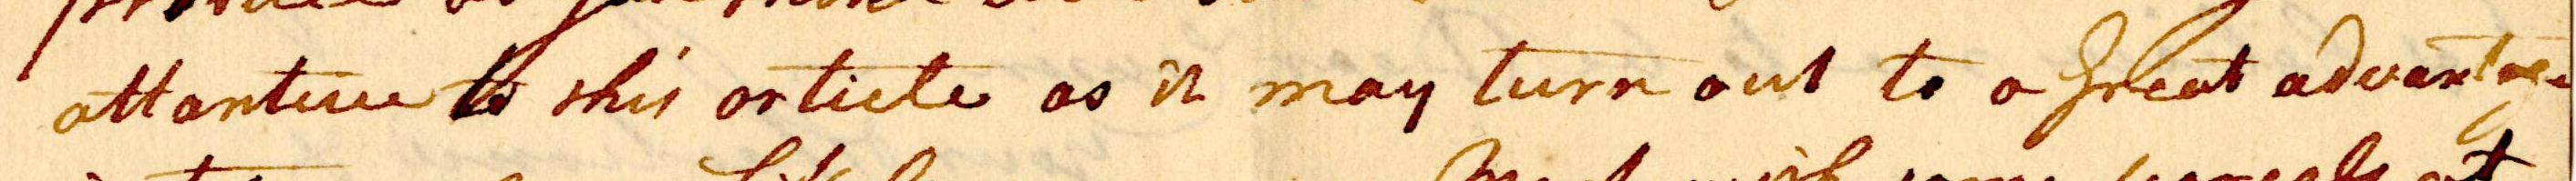attantive to this article as it may turn out to a great adventage
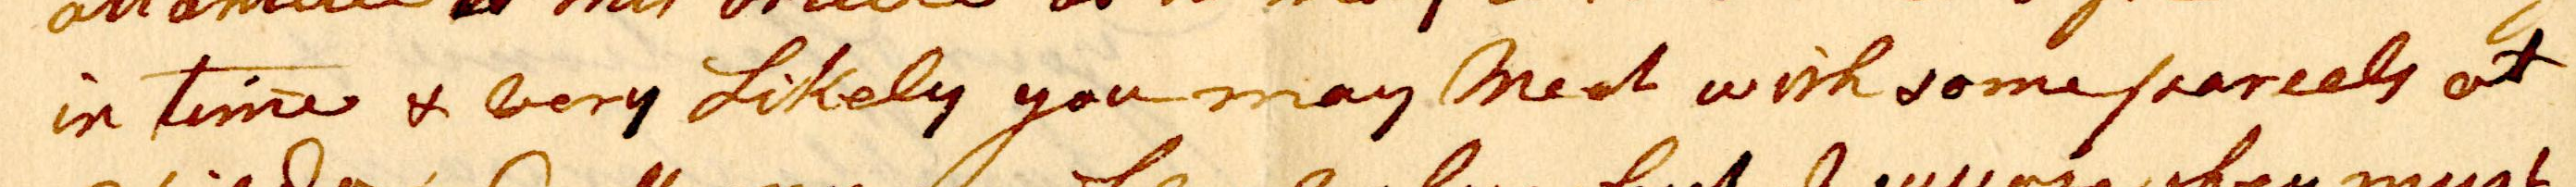in time & very Likely you may meet with some parcels at
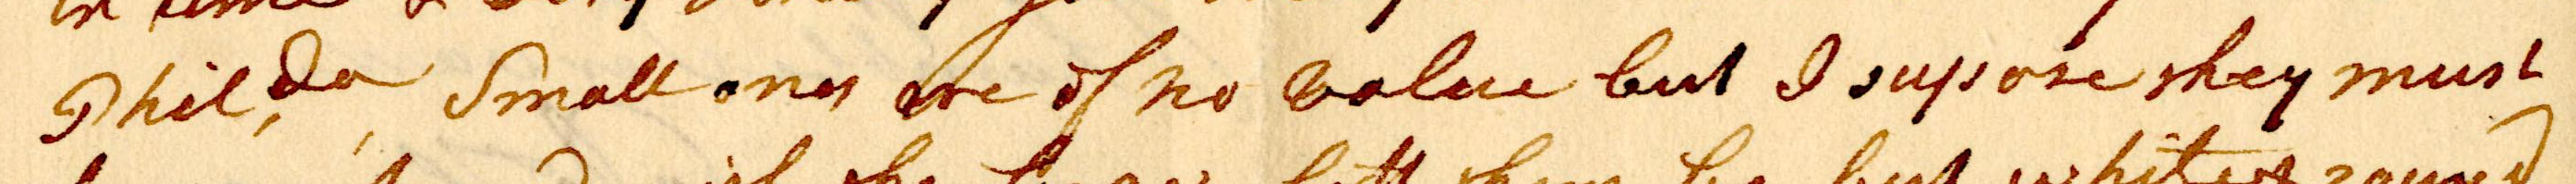phil^da Small ones are of no value but I suppose they must
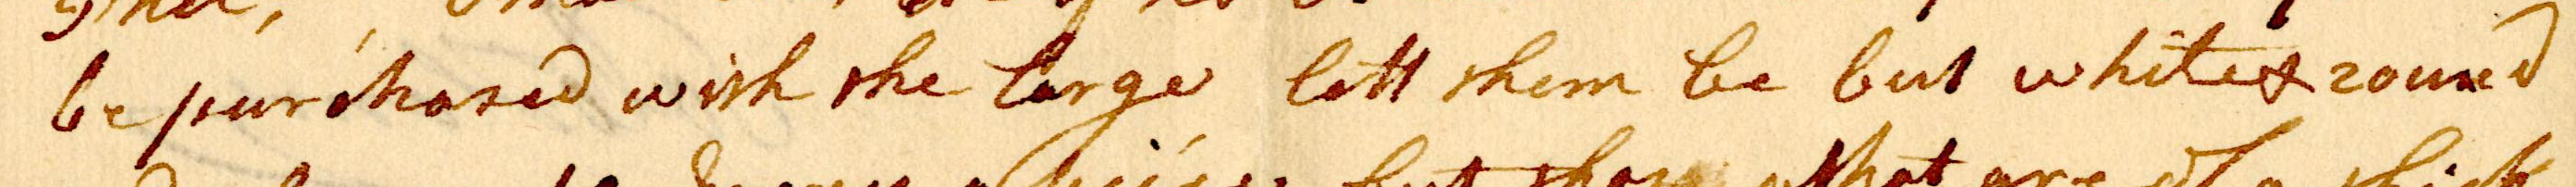be purchased with the large lett them be but white & sound
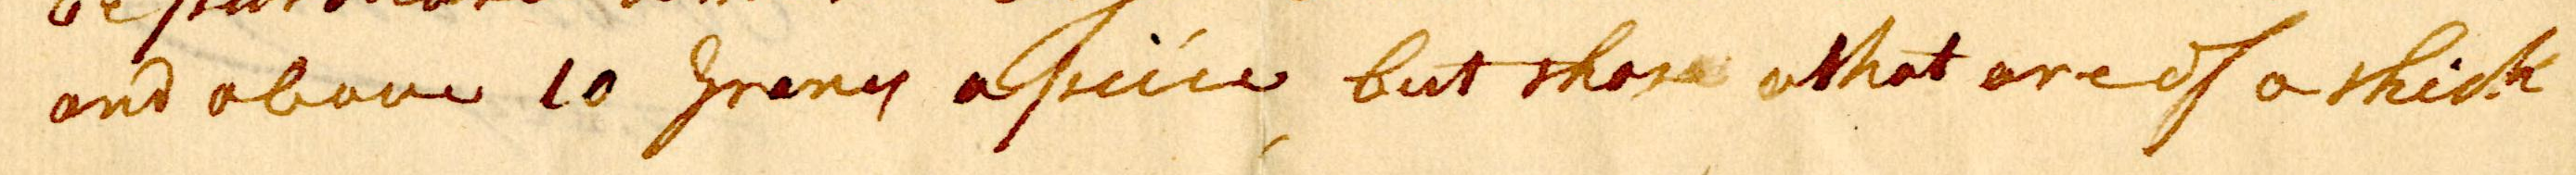and above 10 Granes a piece but those othat are of a thick
